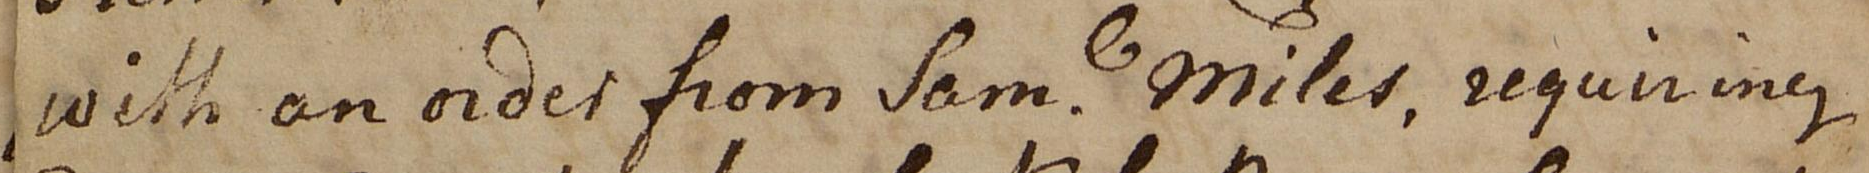with an order from Sam^l. Miles, requiring
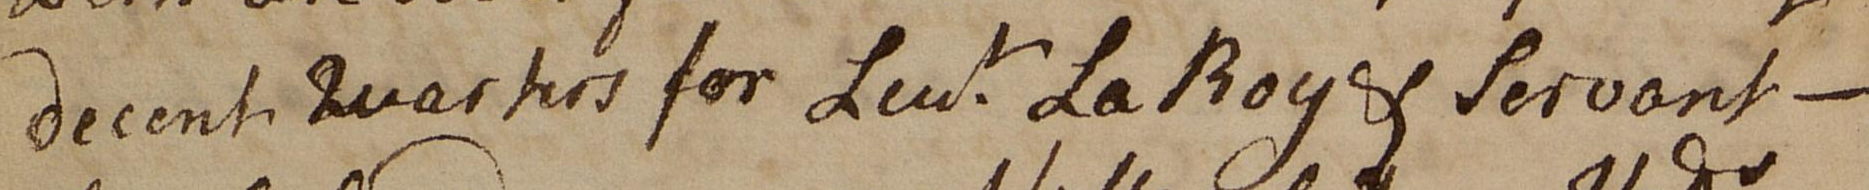decent Quarters for Leu^t. La Roy & Servant-
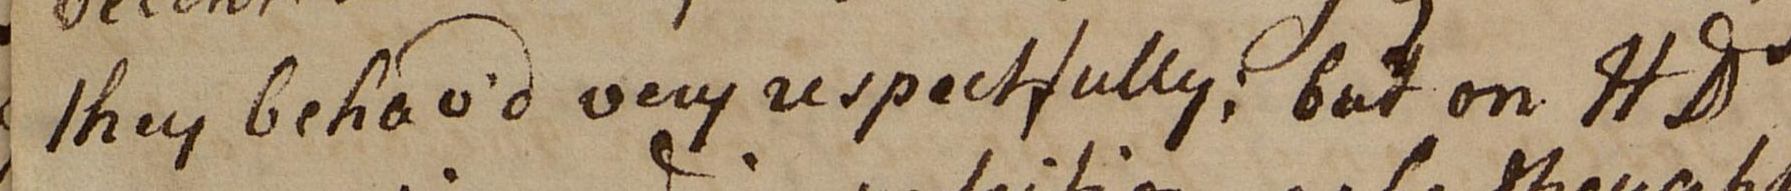they behav'd very respectfully, but on HD^s
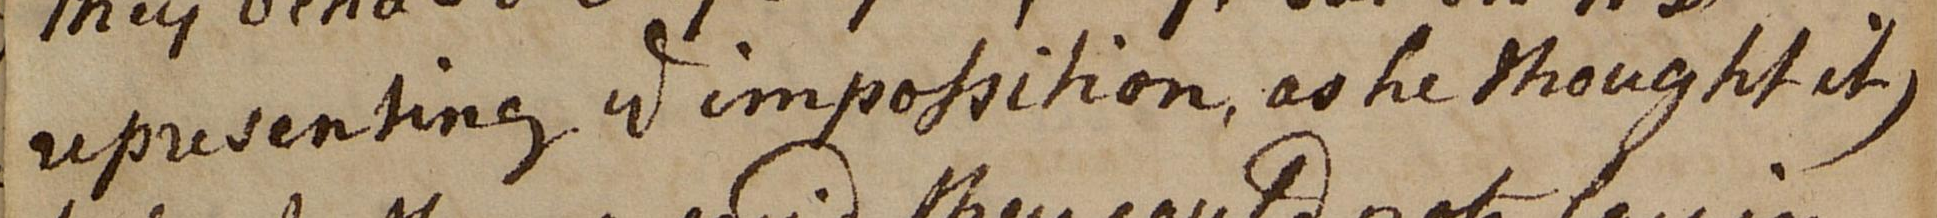representing y^e impossition, as he thought it)
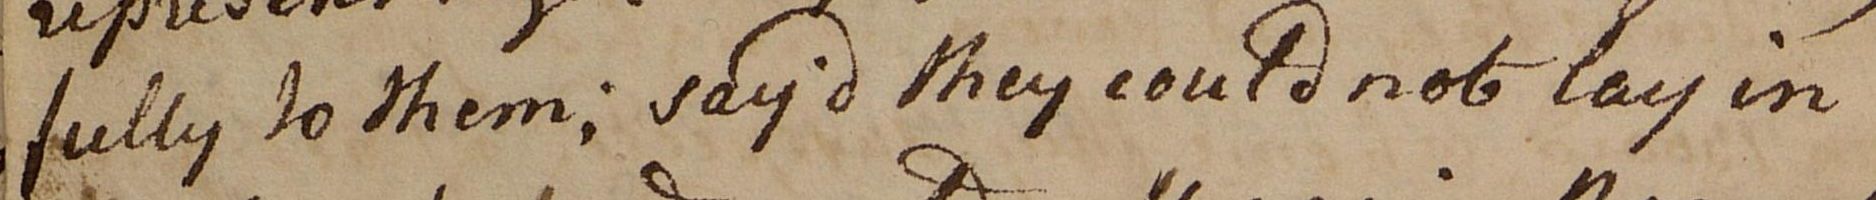fully to them; say'd they could not lay in
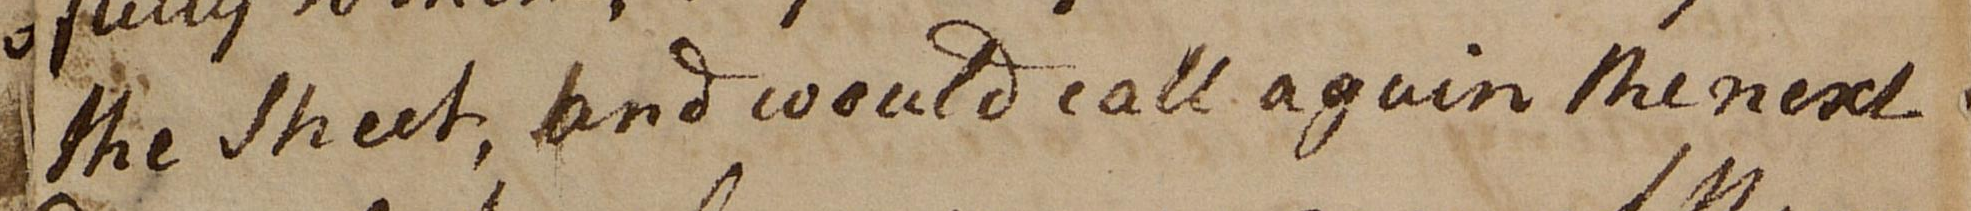the Street, and would call again the next
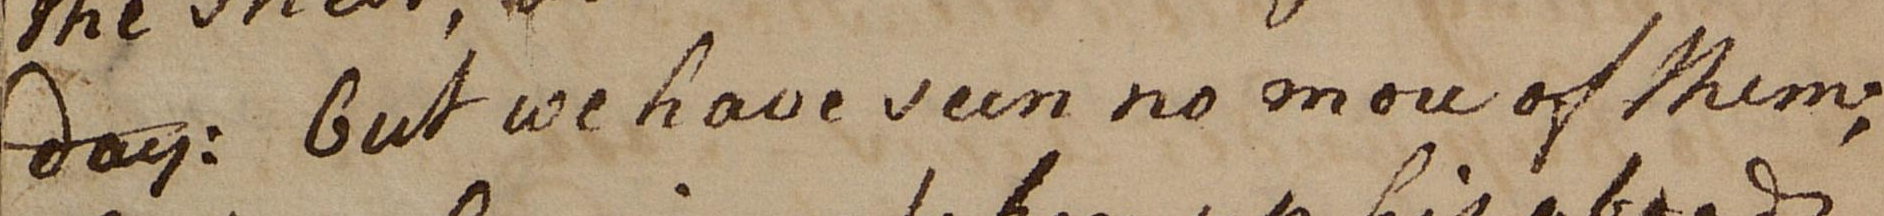day: but we have seen no more of them,
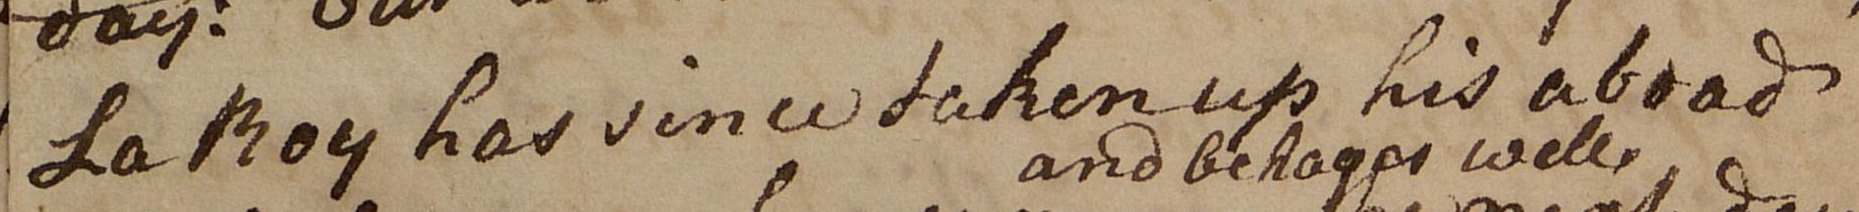La Roy has since taken up his aboad
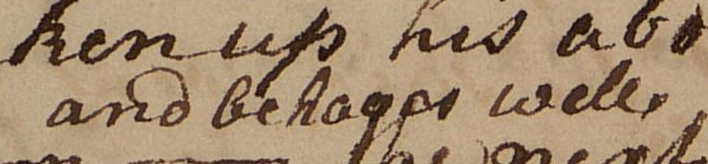and behaves wells
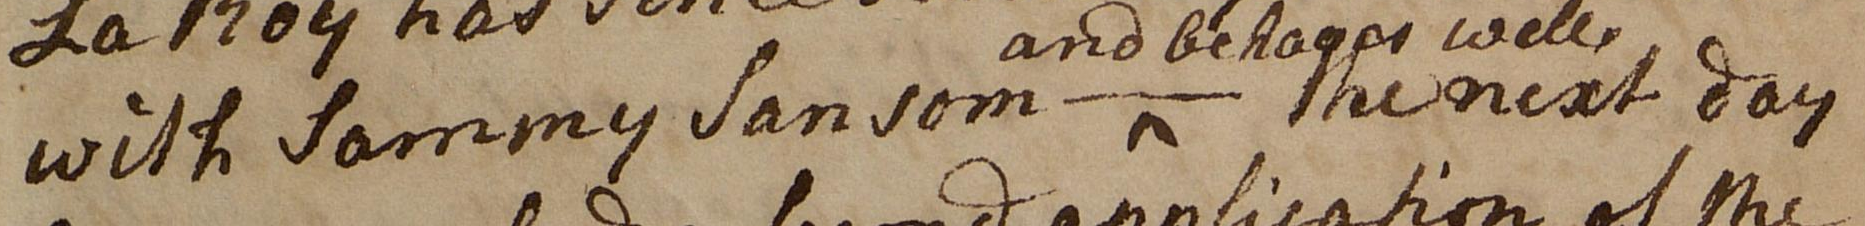with Sammy Sansom- the next day
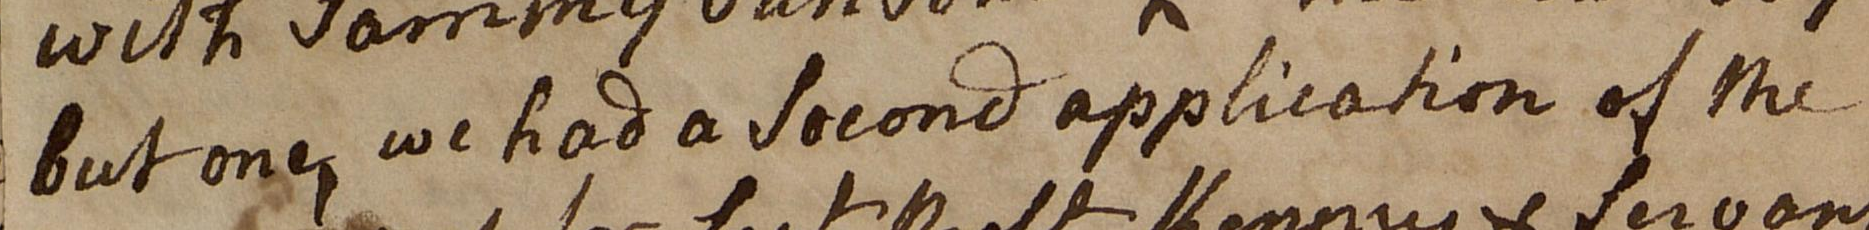but one, we had a Second application of the
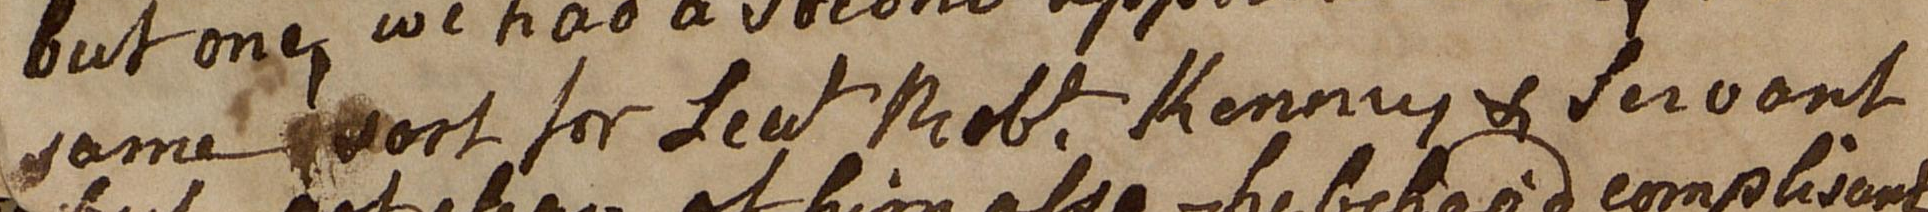same sort for Leu^t Rob^t Kenney & Servant
